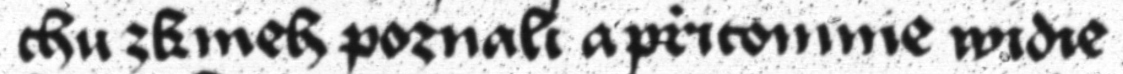chu zknieh poznali a pṙitomnie widie
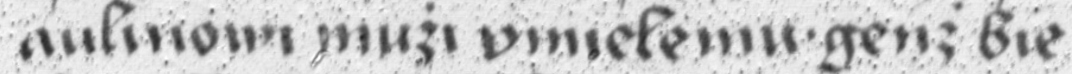aulinowi muži vmielemu.genż bie
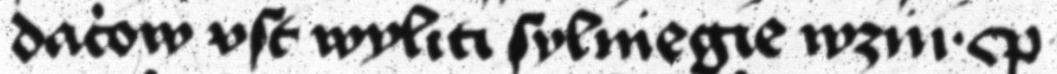daċow vſt wyliti ſylniegíe wzṅí.P
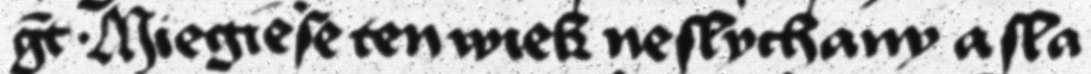g̑t.Miegíeẛe tenwiek neſlychany a ſla
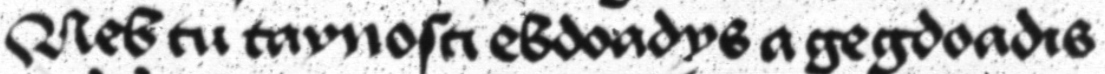Neb tu taynoſti ebdoadys a gegdoadis
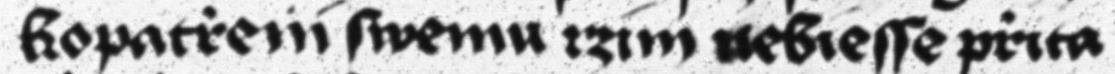kopatṙeṅí ſwemu rzím nebíeſſe pṙita
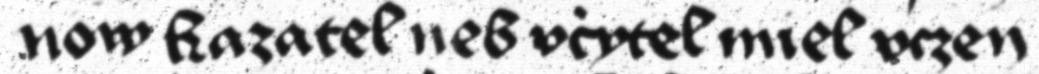now kazatel neb vċytel miel vczen
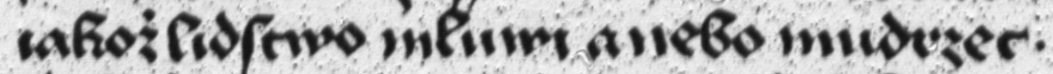iakoż lidſtwo mluwí a nebo mudrzec.
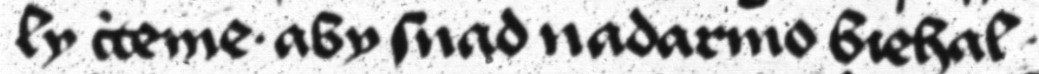ly ċteme.aby ſnad nadarmo biehal
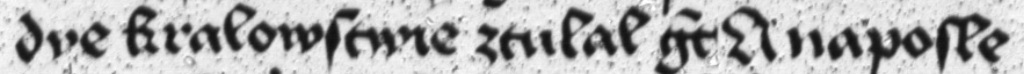dye kralowſtwíe ztulal g̑t A napoſle
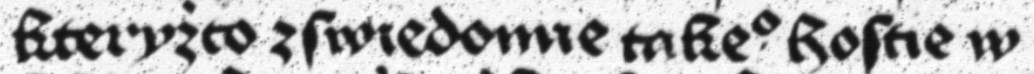kterýżto zſwiedomíe take° hoſtie w
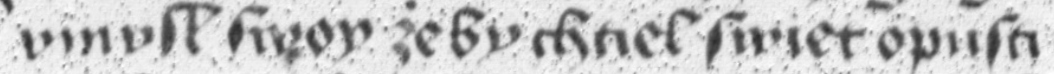vmyſl ſwoy że by chtiel ſwiet opusti
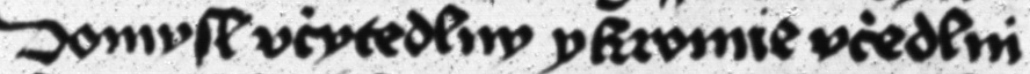Domyſl vċytedlny ykromie vċedlni
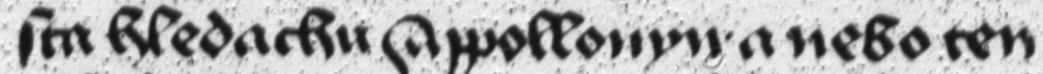ſta hledachu Appollonyn.a nebo ten
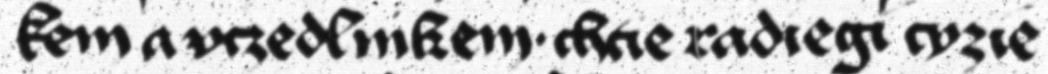kem a vczedlnikem.chtie radiegí cyzíe
